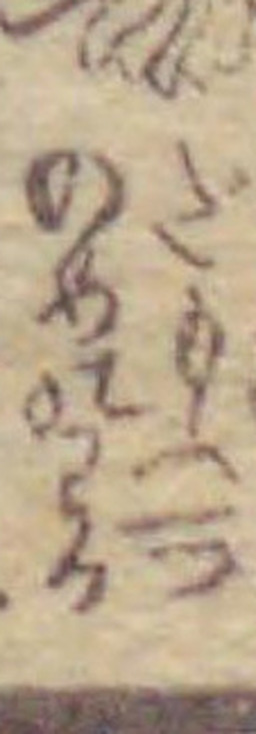のめのわか
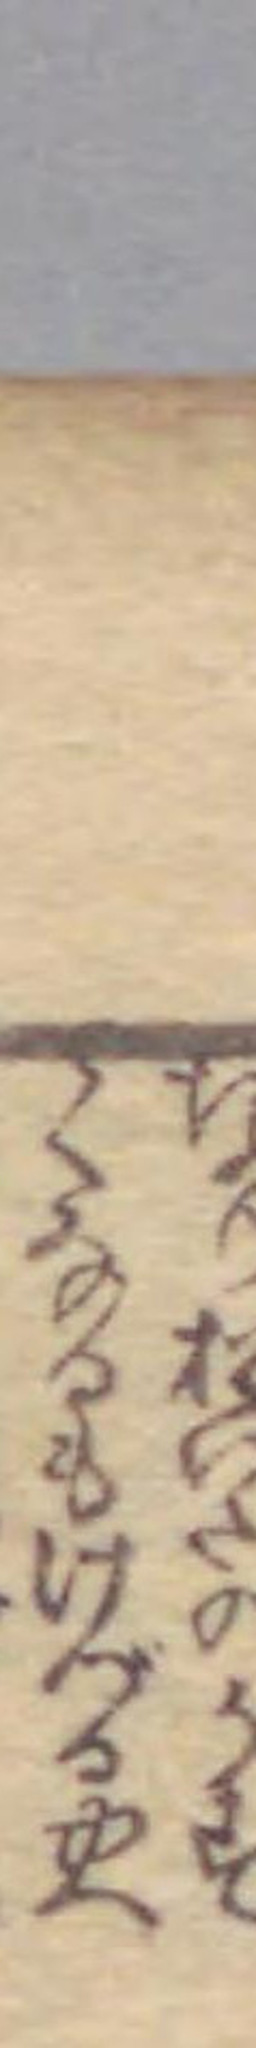くなるもけづるゆへ
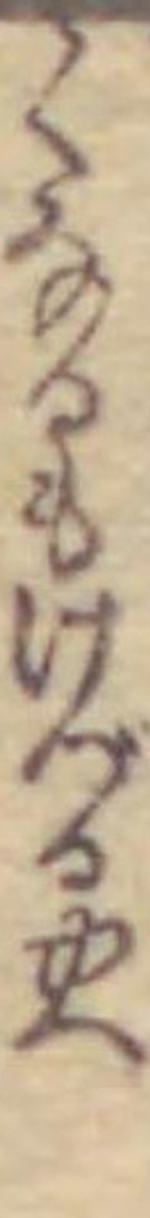くなるもけづるゆへ
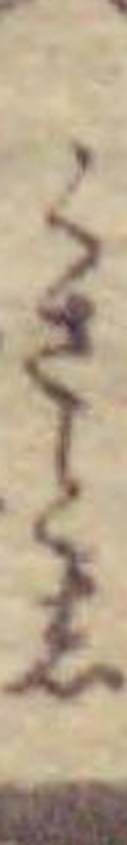くさとし
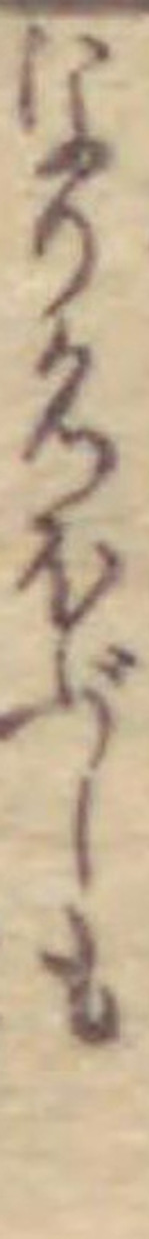なりかつほぶしもｓ
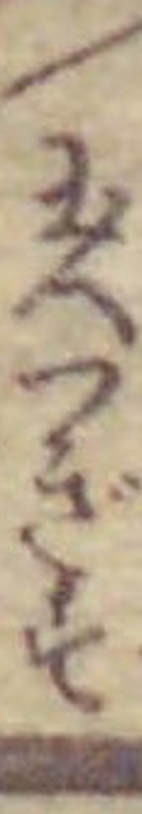玉へつぎす
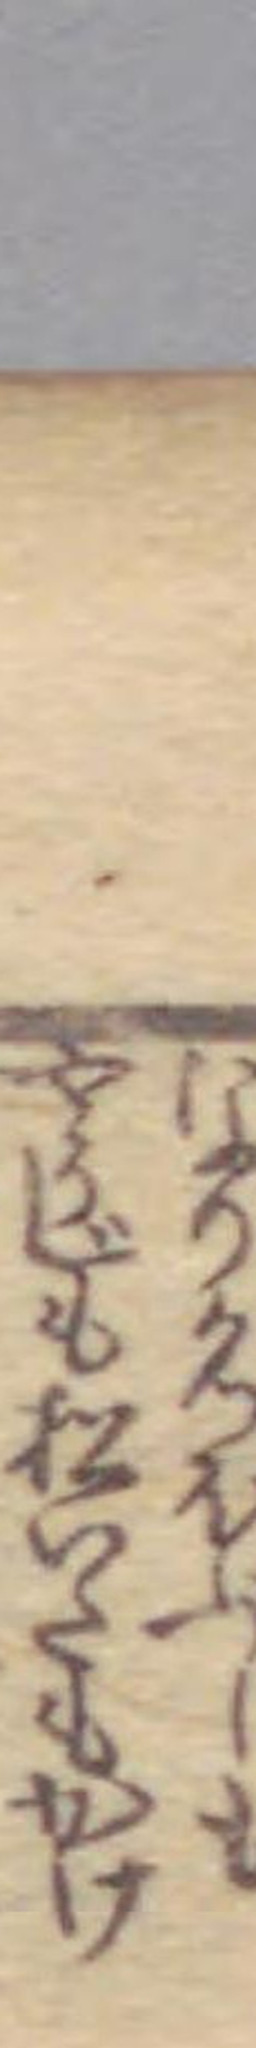やうじも松いたもかけ
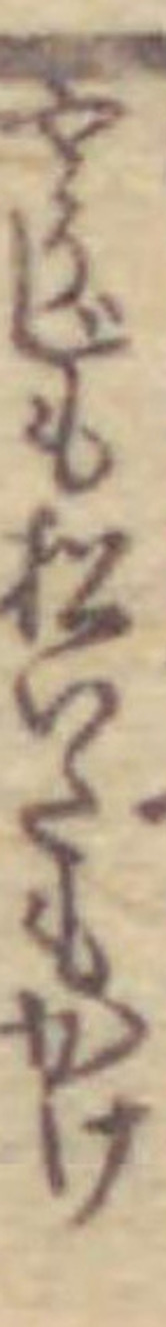やうじも松いたもかけ
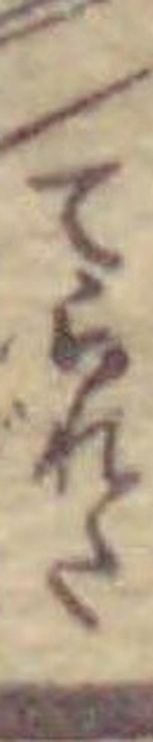てられた
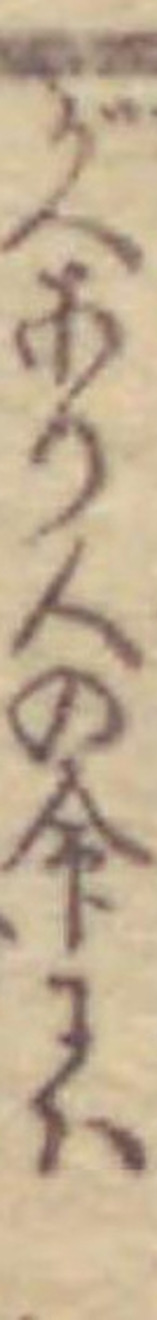がへあり人の命には
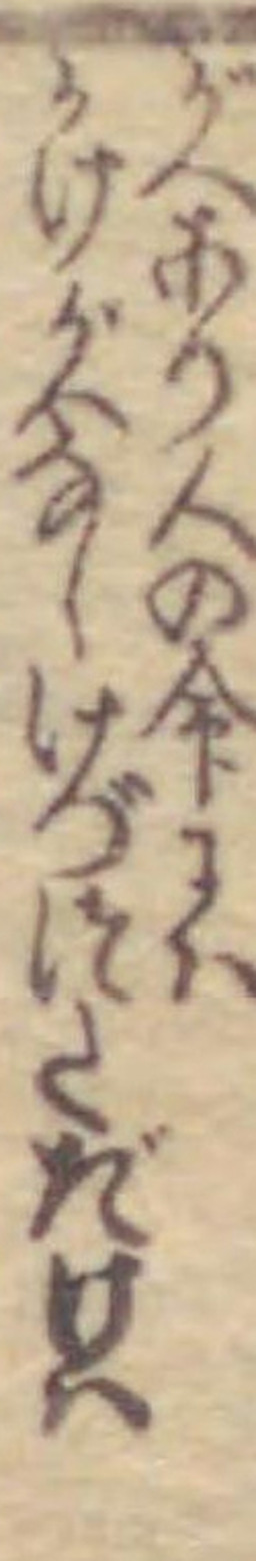かけがへなしけづつただけは
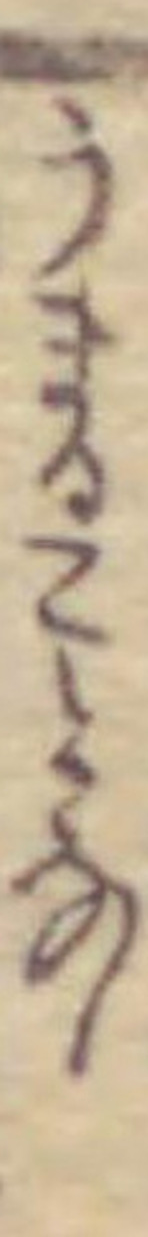うまることなし
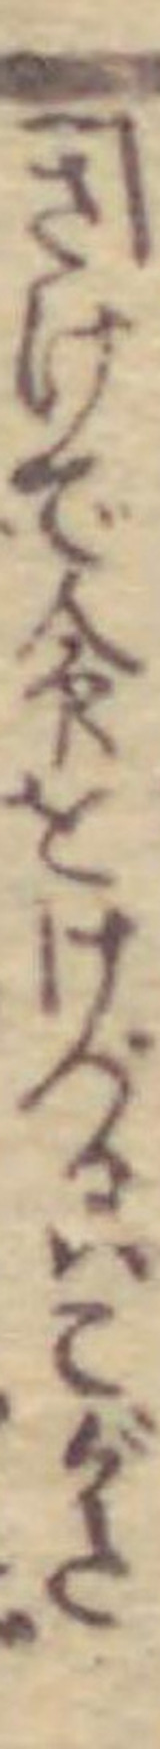〽さけで命をけづるはこがた
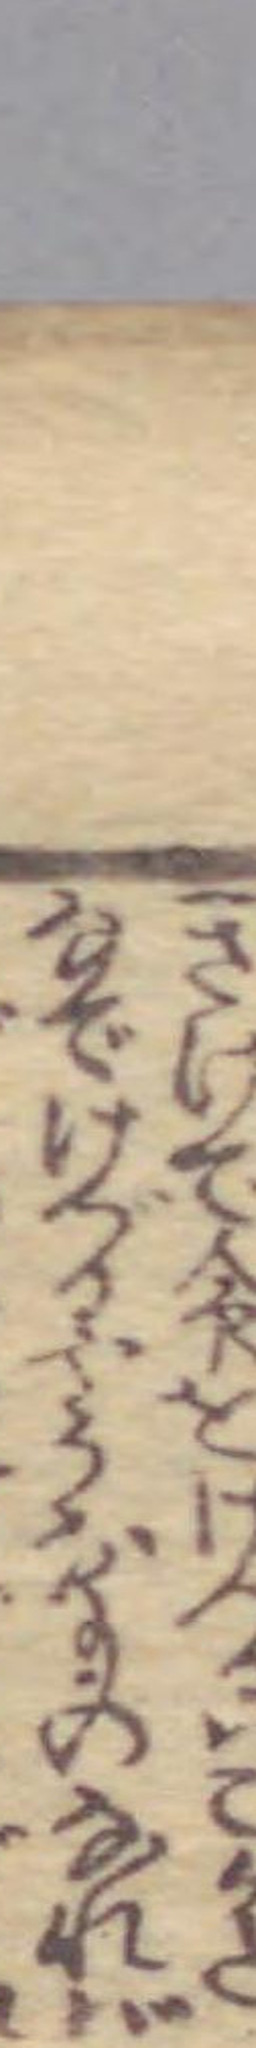なでけづるやうなものなれば
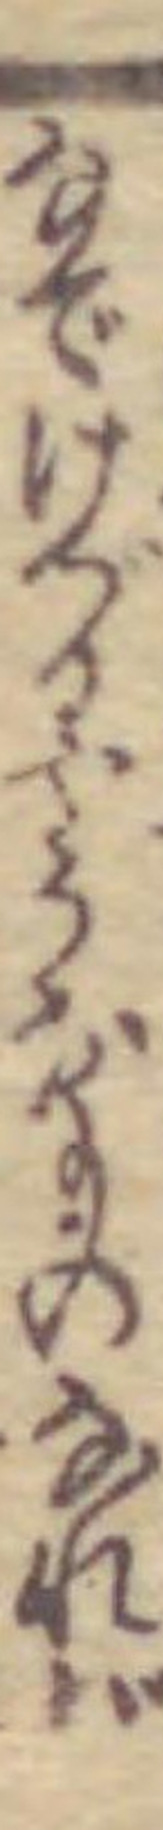なでけづるやうなものなれば
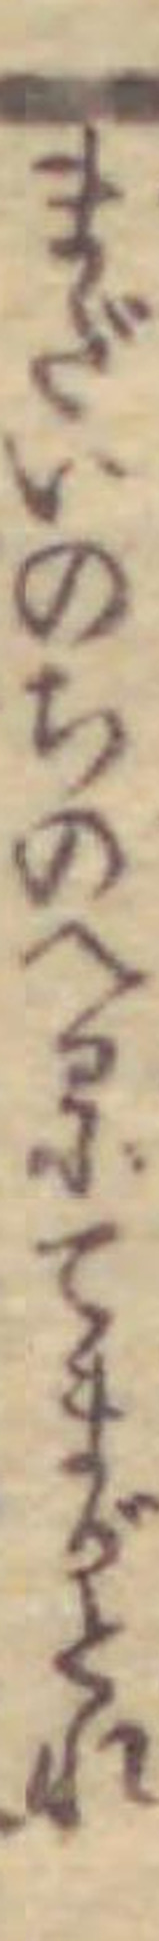まだいのちのへるてまがとれ
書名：御誂染長寿小紋 : 3巻
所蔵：国立国会図書館 National Diet Library, JAPAN
